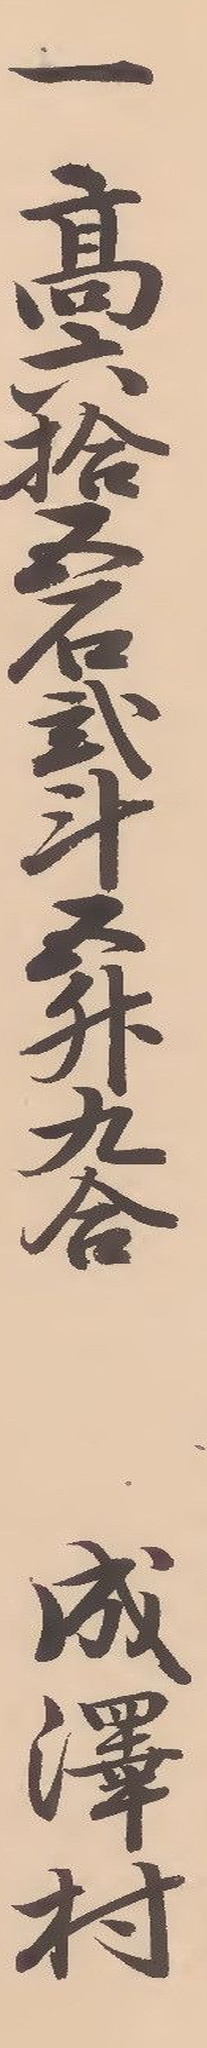一高六拾五石弐斗五升九合成沢村
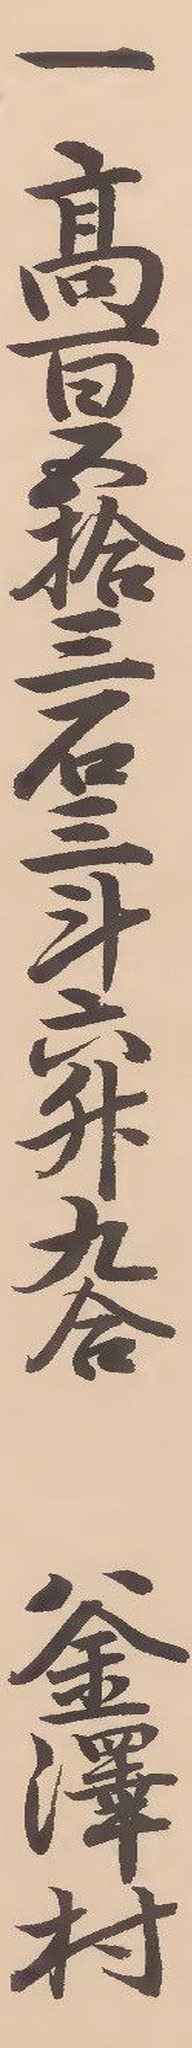一高百五拾三石三斗六升九合釜沢村

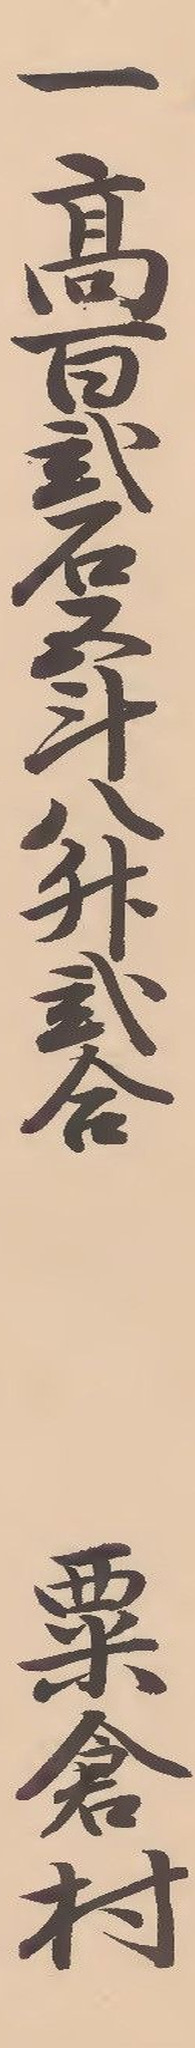一高百弐石五斗八升弐合粟倉村
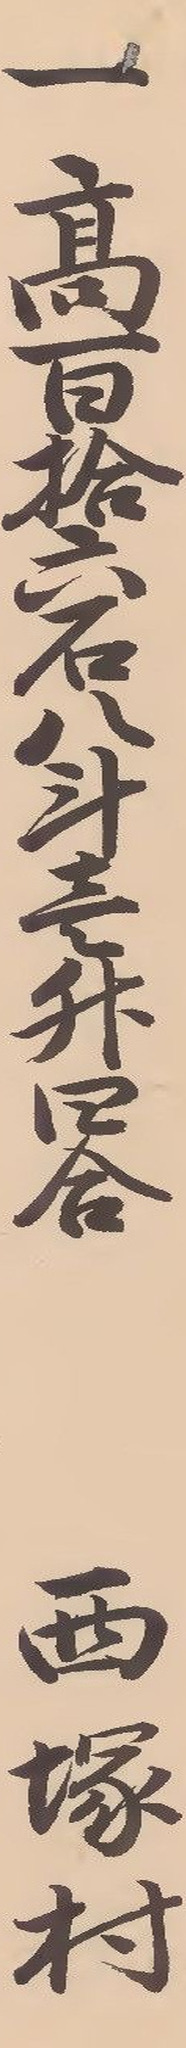一高百拾六石八斗壱升四合西塚村
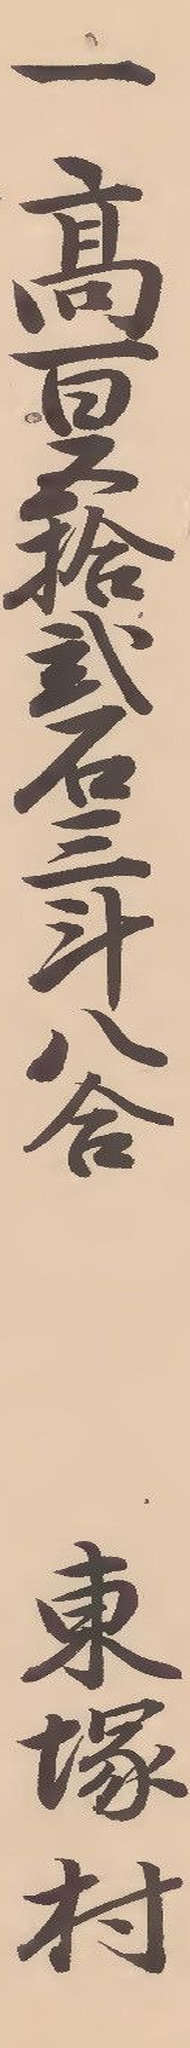一高百五拾弐石三斗八合東塚村
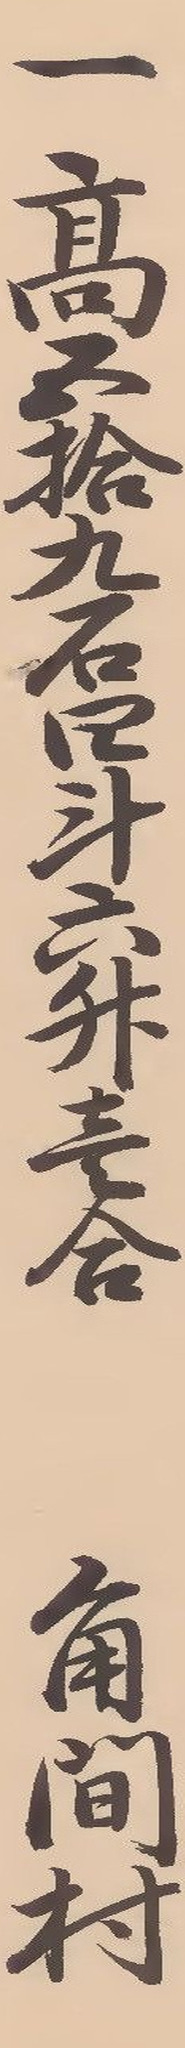一高五拾九石四斗六升壱合角間村
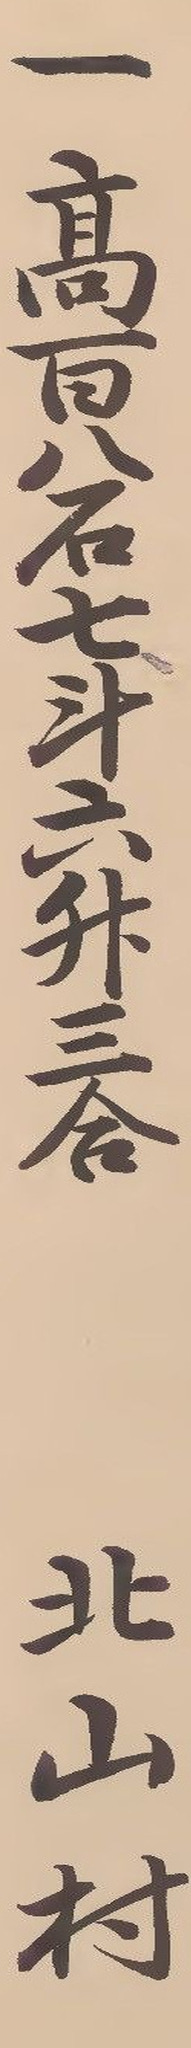一高百八石七斗六升三合北山村
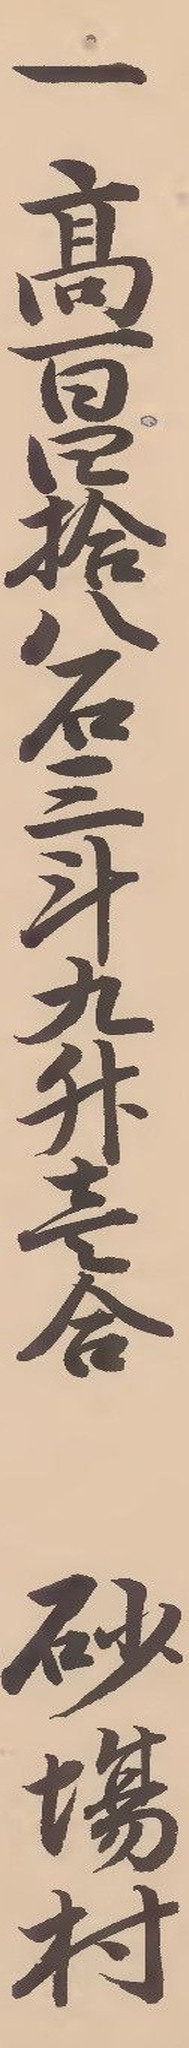一高百四拾八石三斗九升壱合砂場村
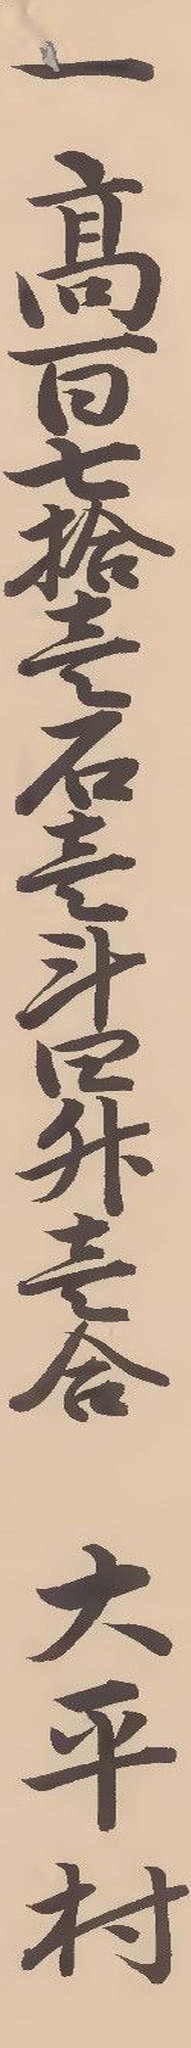一高百七拾壱石壱斗四升壱合大平村
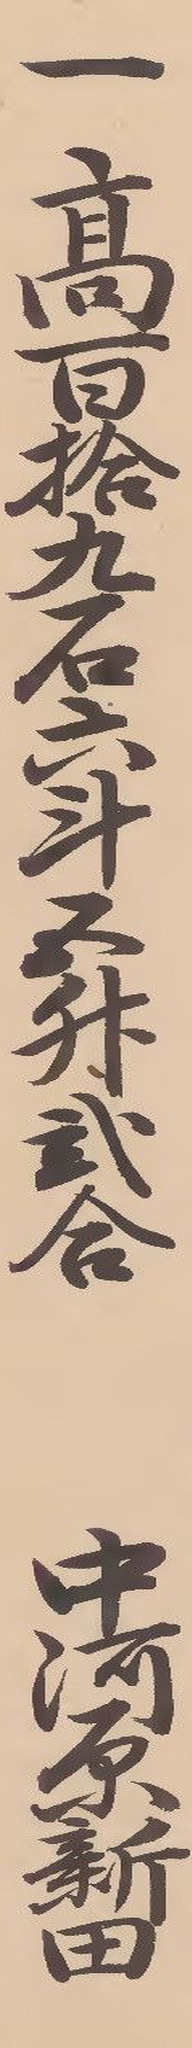一高百拾九石六斗五升弐合中河原新田

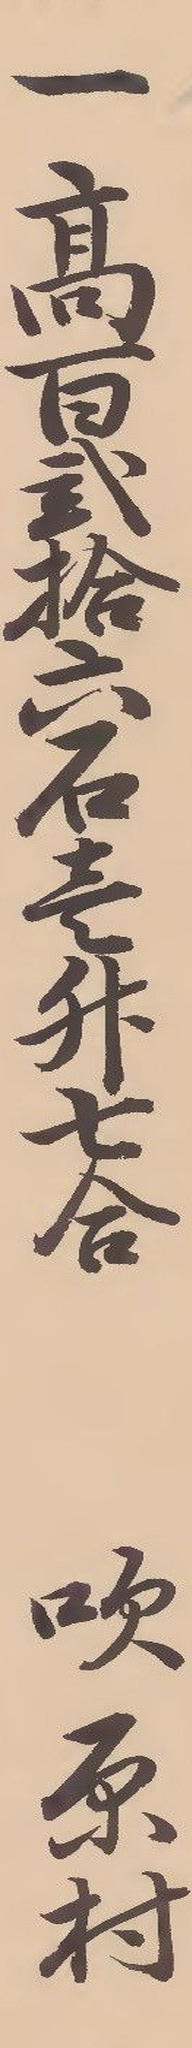一高百弐拾六石壱升七合吹原村
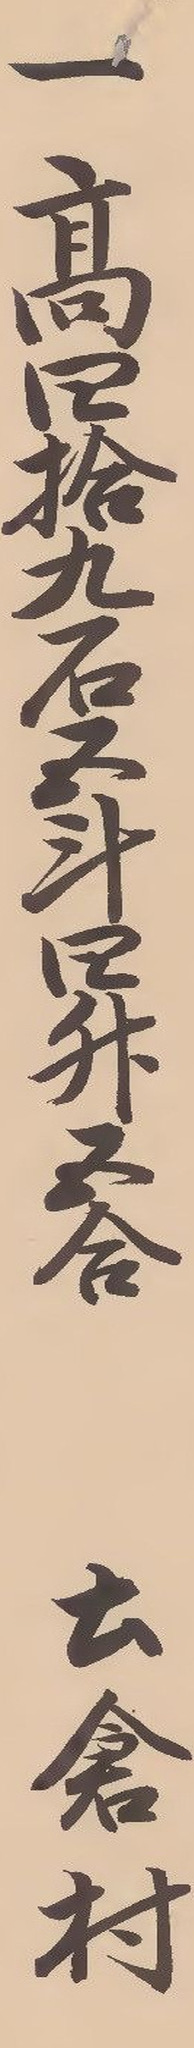一高四拾九石五斗四升五合土倉村
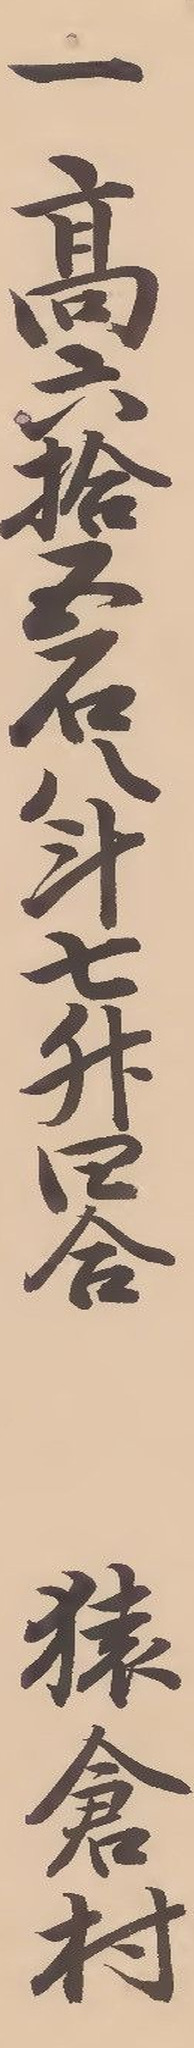一高六拾五石八斗七升四合猿倉村
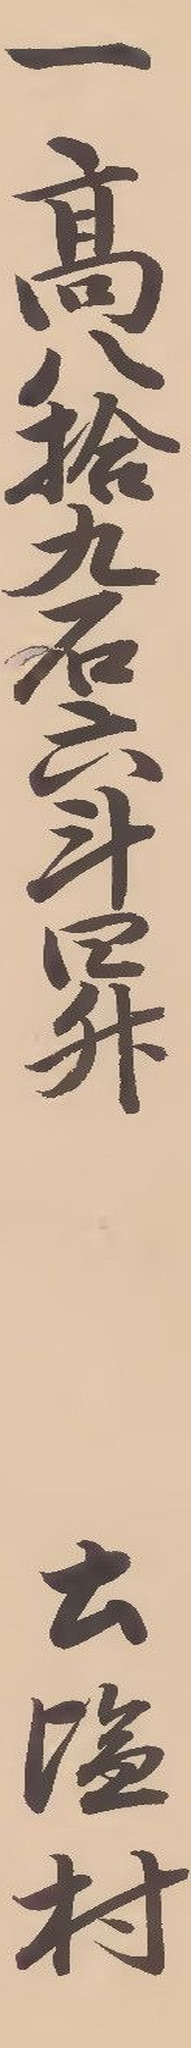一高八拾九石六斗四升土塩村
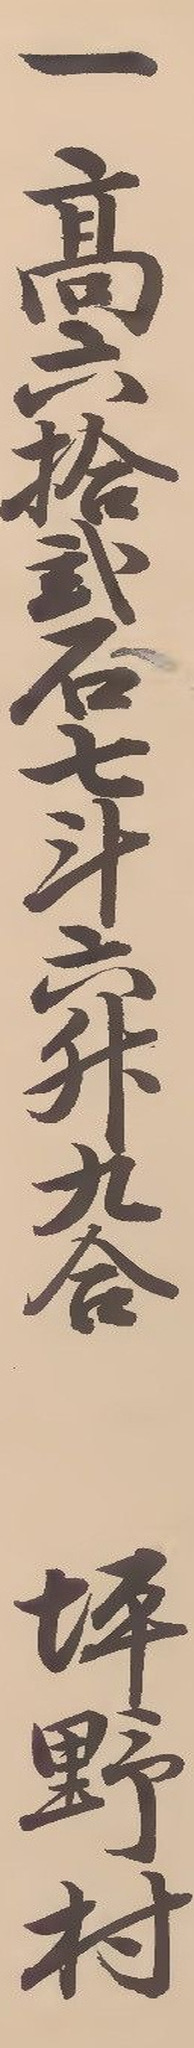一高六拾弐石七斗六升九合坪野村
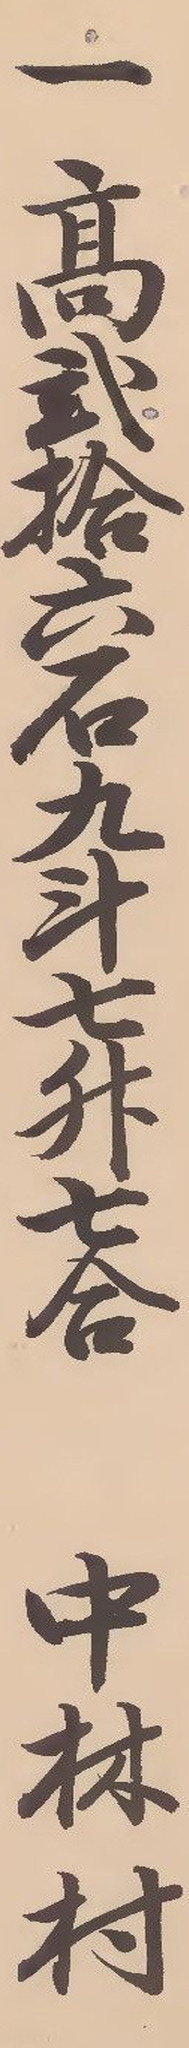一高弐拾六石九斗七升七合中林村
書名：越後国郷帳　上
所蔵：国立公文書館 National Archives of Japan
